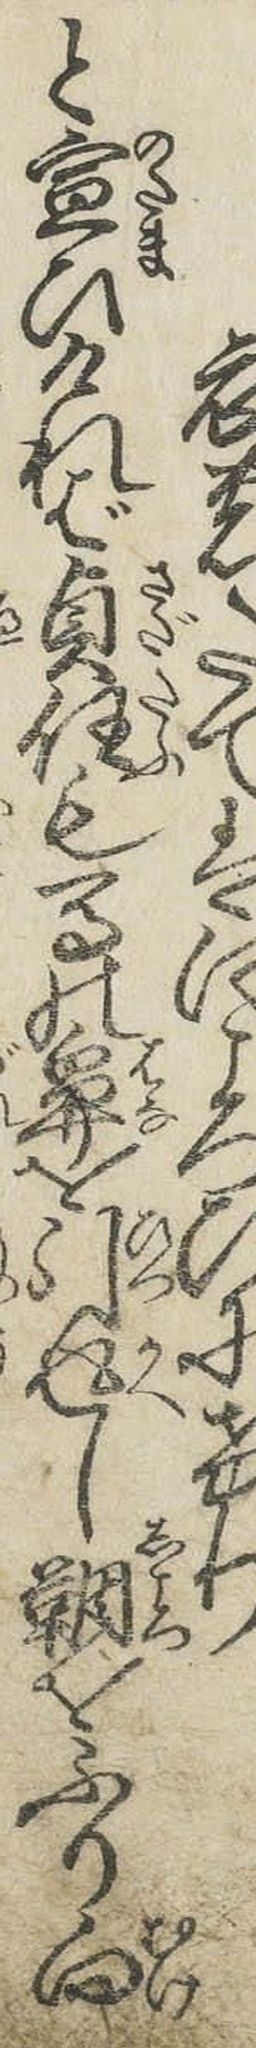と宣ひければ貞任も馬の鼻を引返し𩋙をふり向
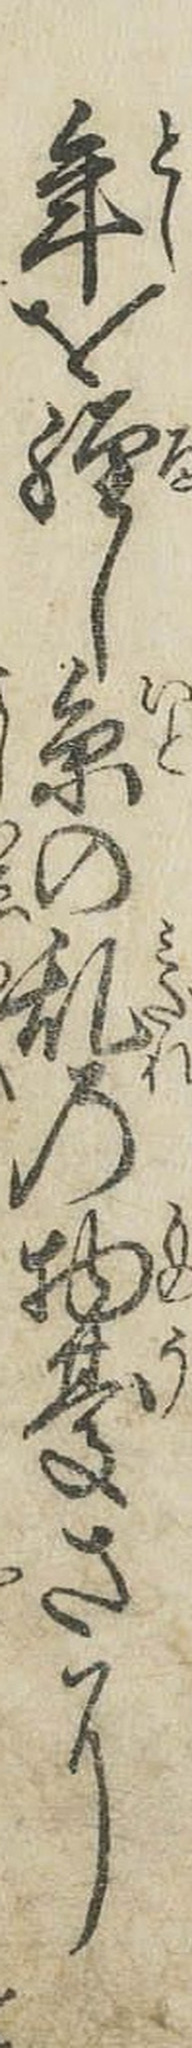年を経し糸の乱乃物憂さに
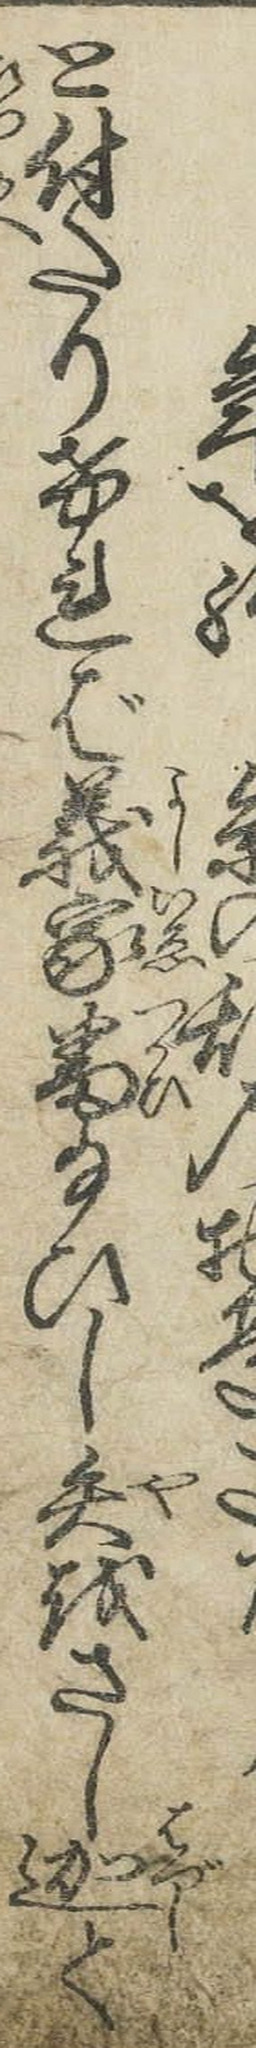と付たりければ義家番給ひし矢をさし迦て
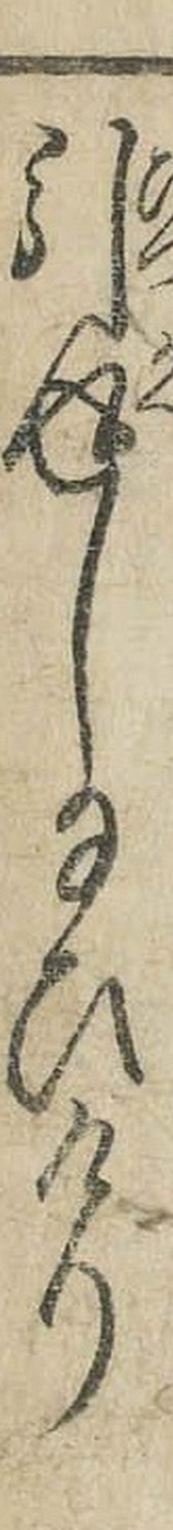引返し給ひけり

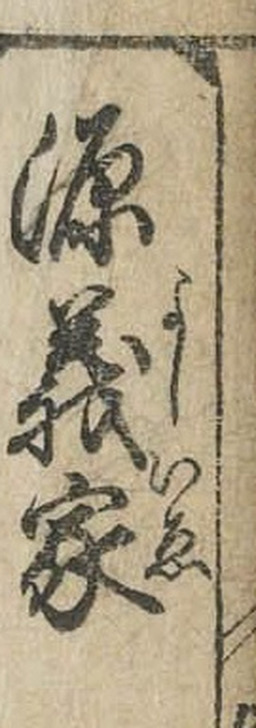源義家
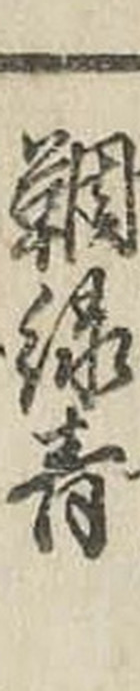𩋙緑青
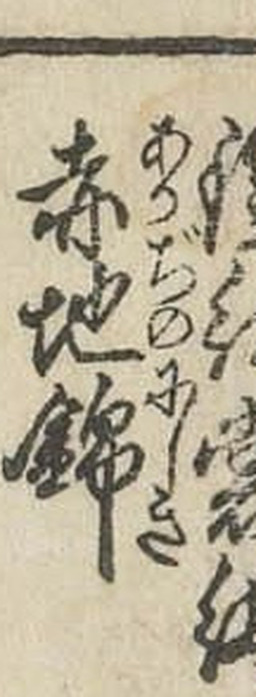赤地錦
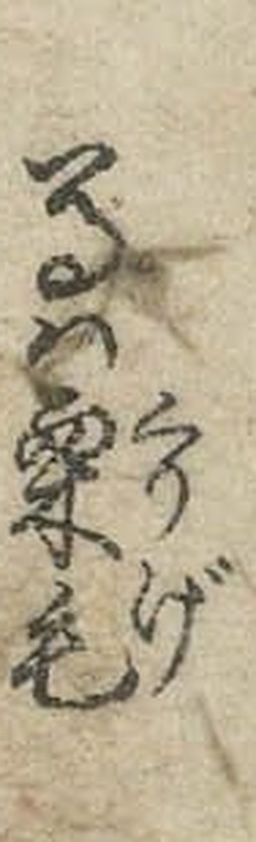馬は栗毛
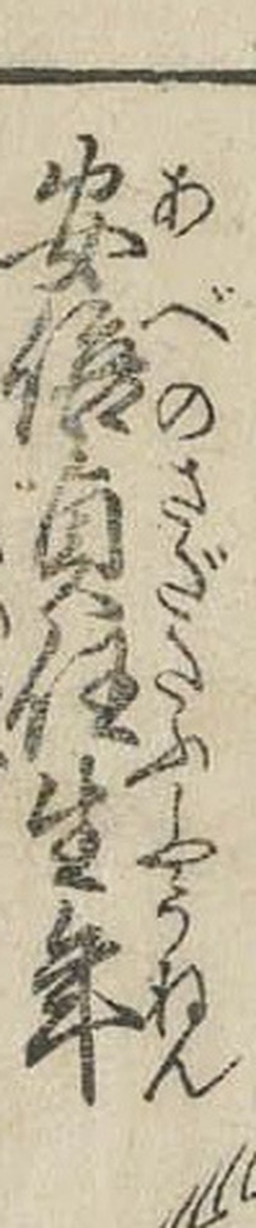安倍貞任生年
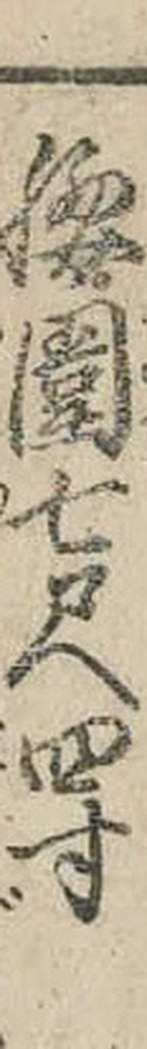腰囲七尺四寸
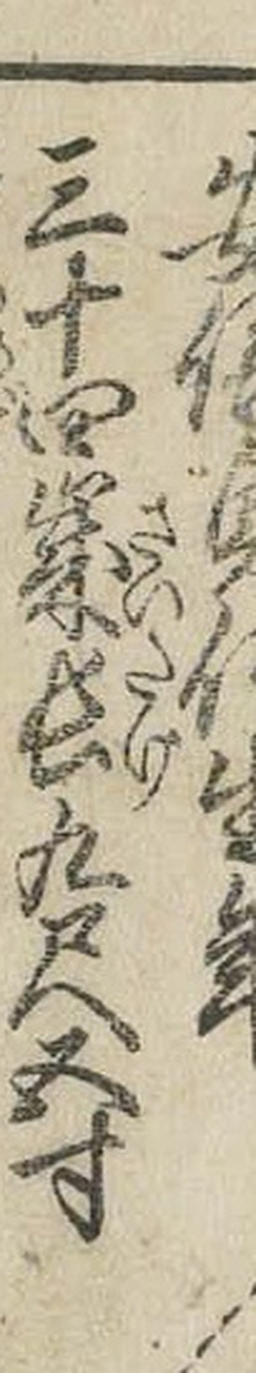三十四歳長九尺五寸
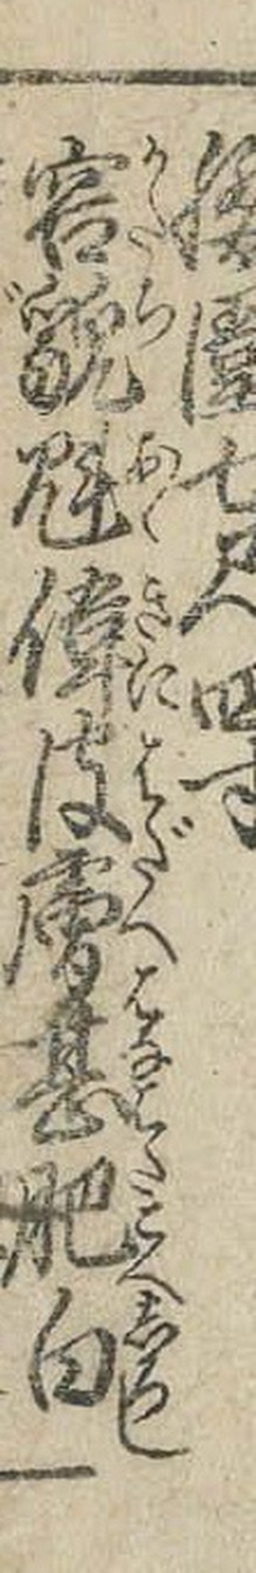容貌魁偉皮膚甚肥白
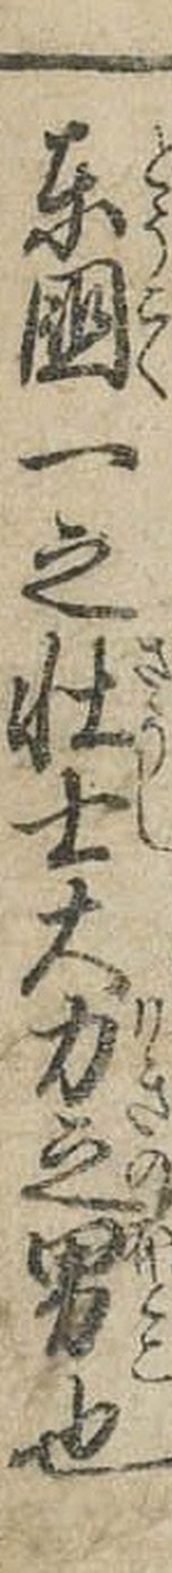東国一之壮士大力之男也

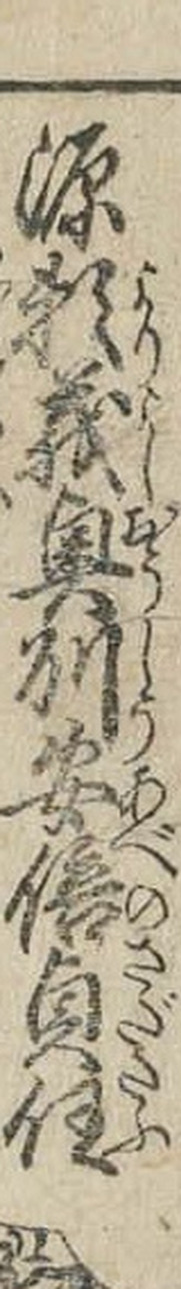源頼義奥州安倍貞任
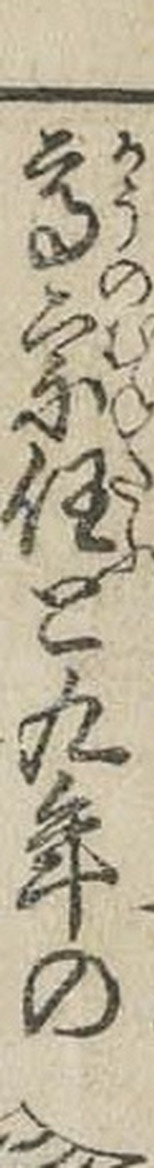高宗任と九年の
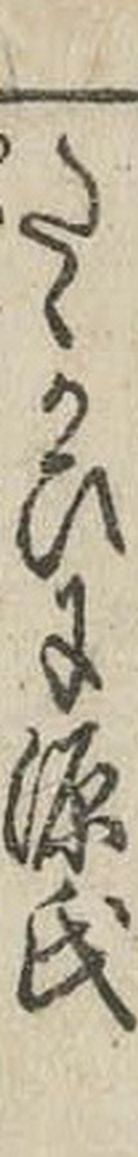たゝかひに源氏
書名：絵本写宝袋 9巻 3之巻
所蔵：東京学芸大学教育コンテンツアーカイブ
